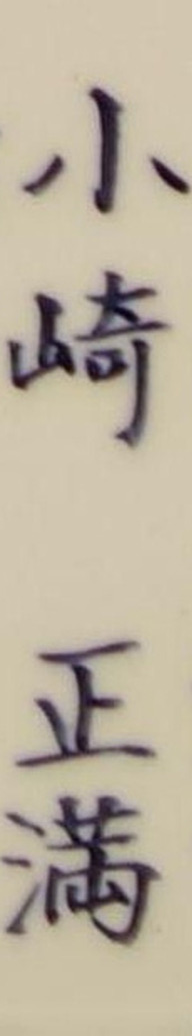小崎正満
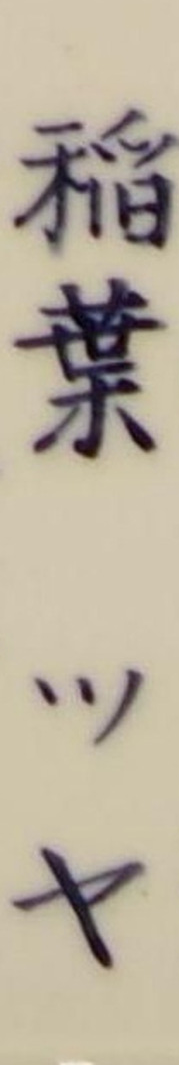稲葉ツヤ
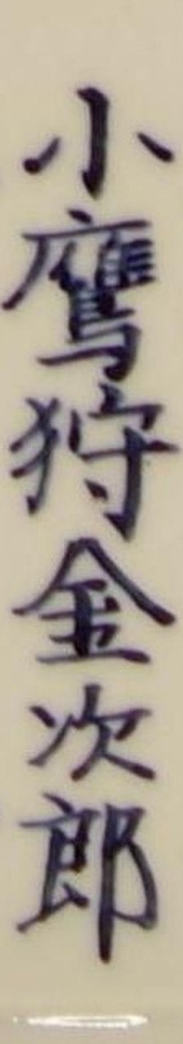小鷹狩金次郎
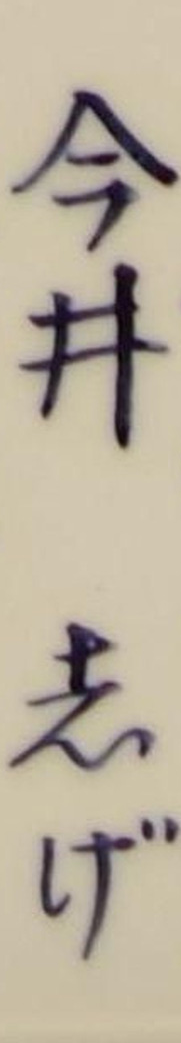今井しげ
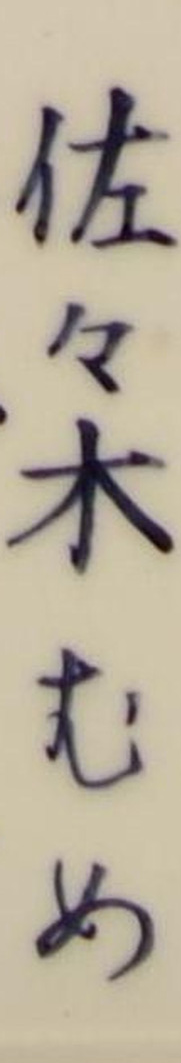佐々木むめ
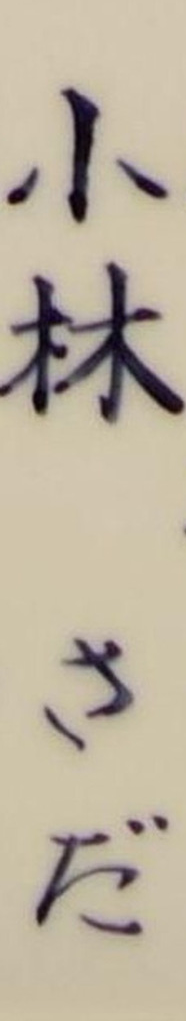小林さだ
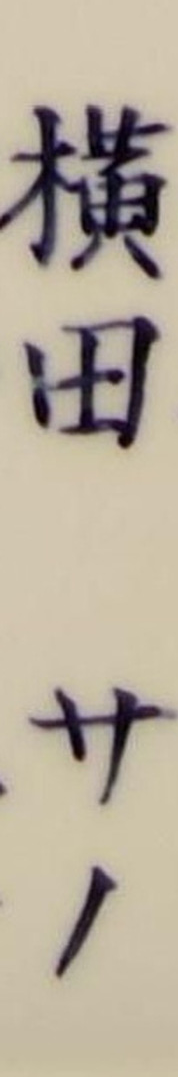横田サノ
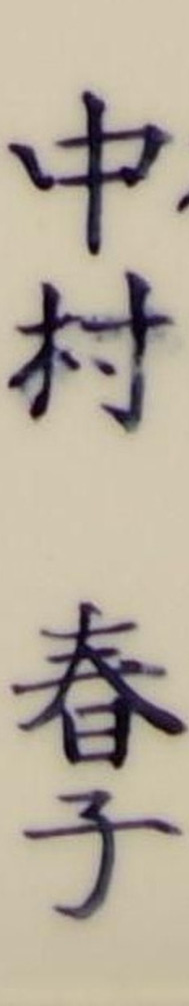中村春子
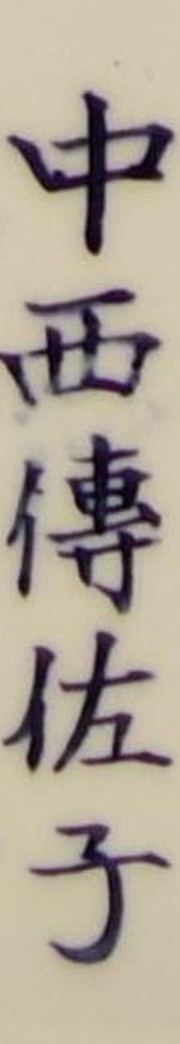中西傳佐子
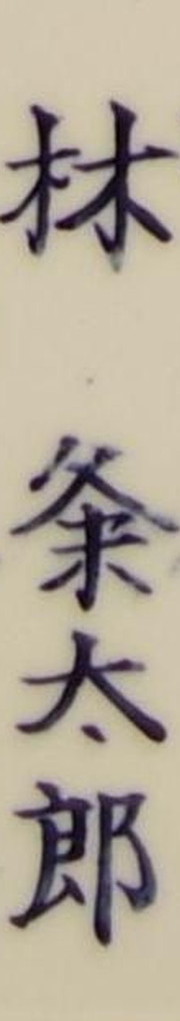林粂太郎
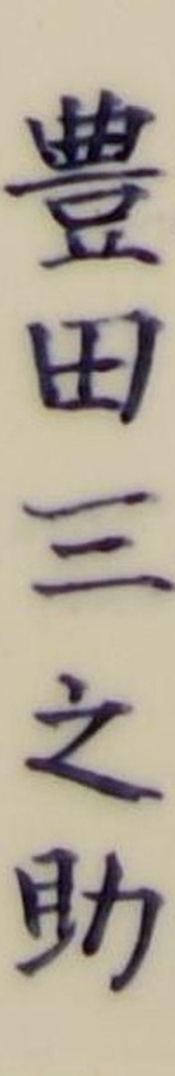豊田三之助
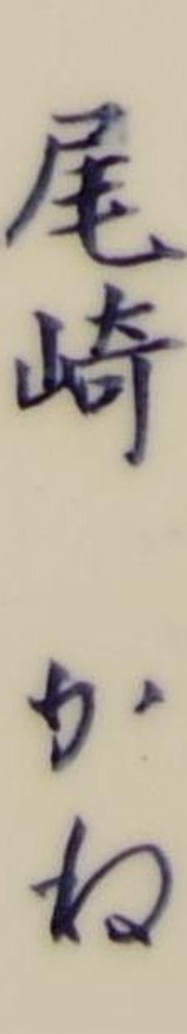尾崎かね
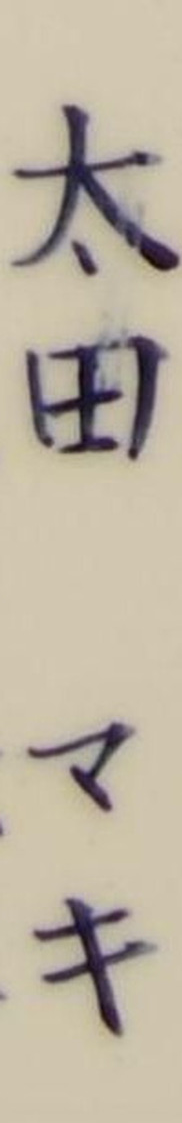太田マキ
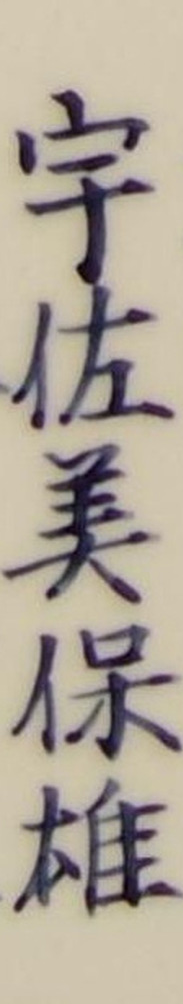宇佐美保雄
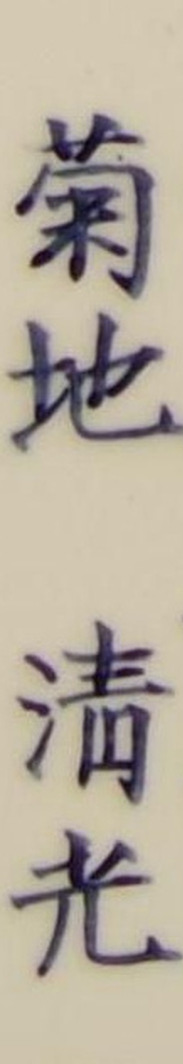菊地清光
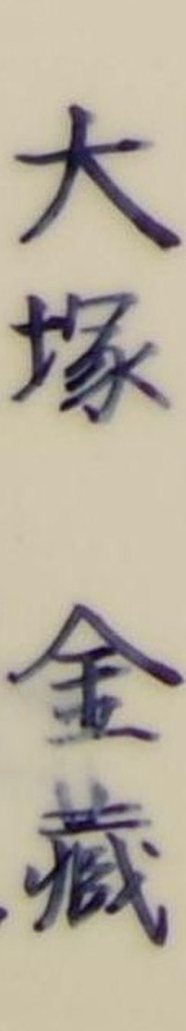大塚金蔵
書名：E~L
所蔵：高野山金剛峯寺
